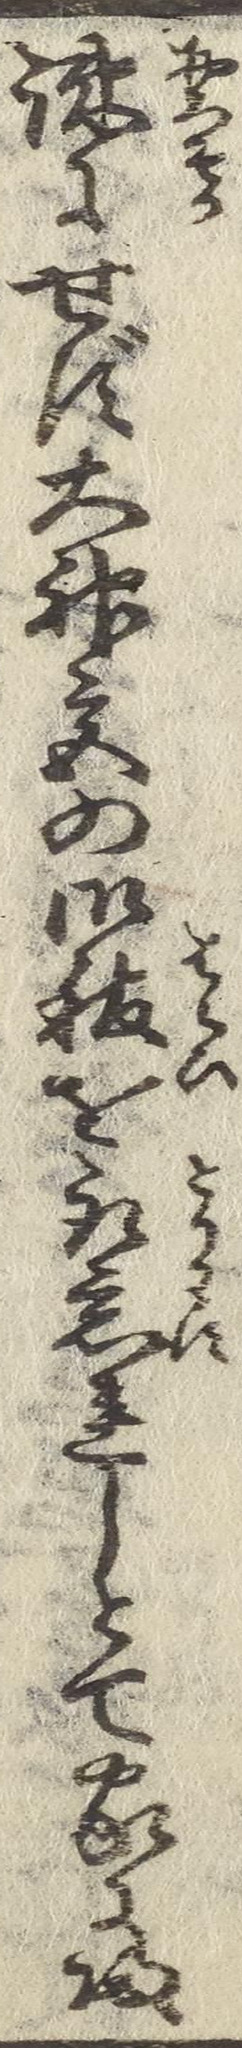疎にせず大神宮の御祓を取忘れしとて家に帰
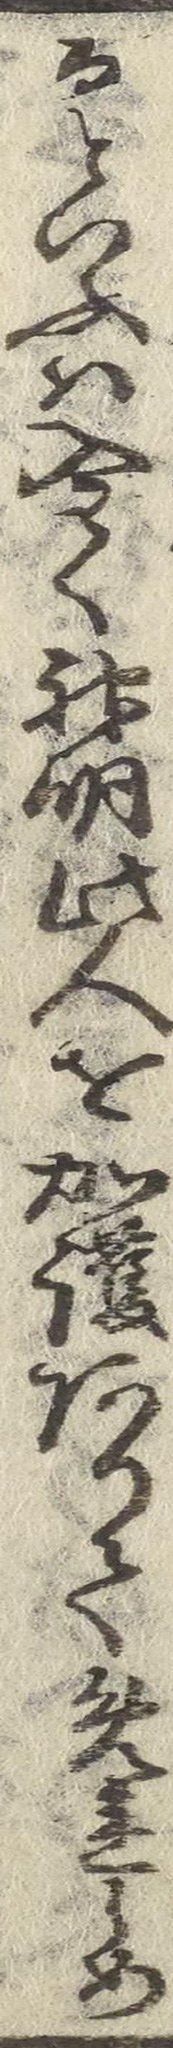るといふは全く神明此人を加護ありて免れしめ
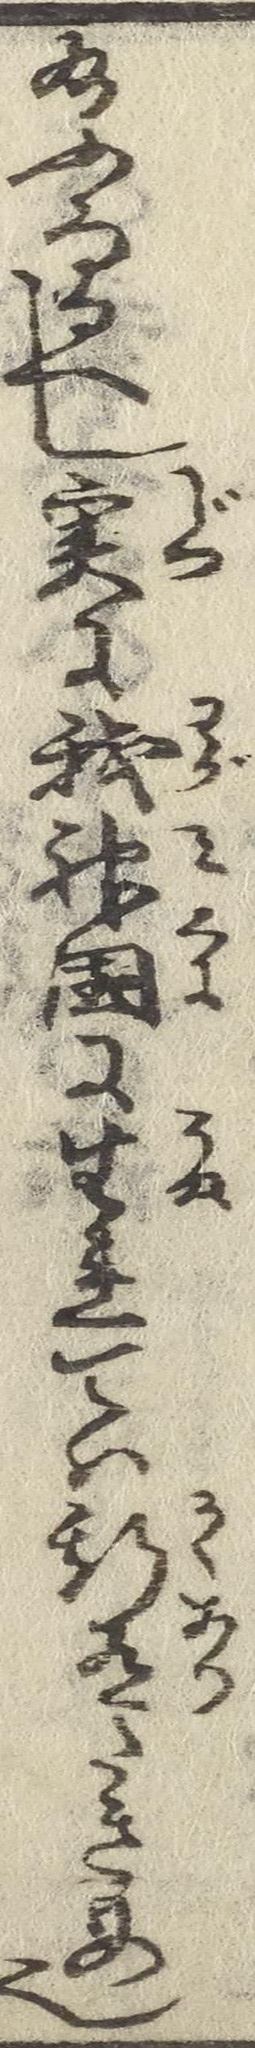給ふるるへし実に我神国に生れては斯有たきもの也

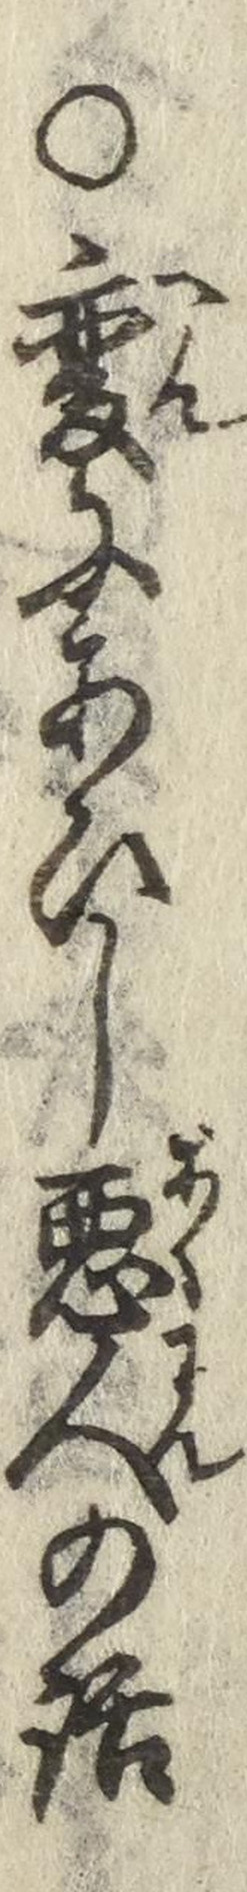○変にあひし悪人の話
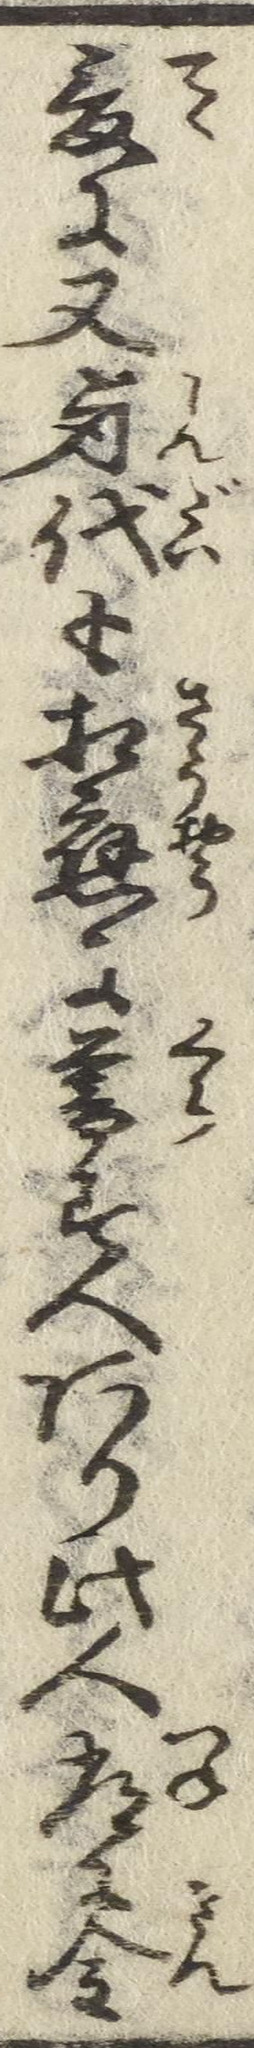爰に又身代も相応に暮す人あり此人常に金
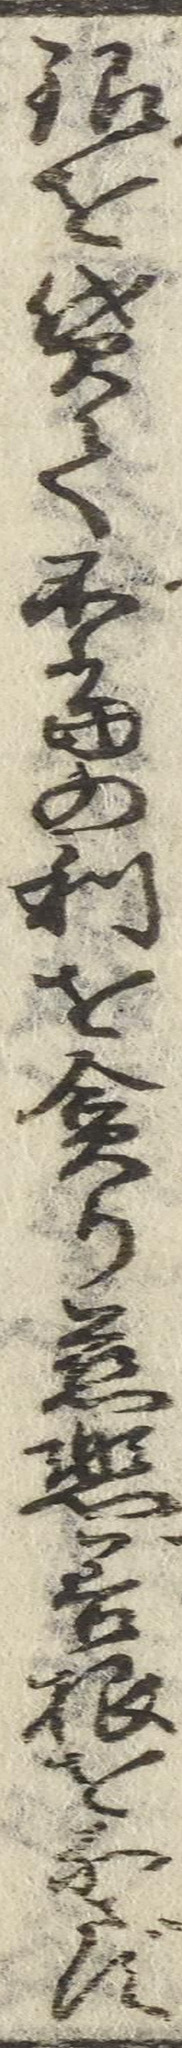銀を貸て不当の利を貪り慈悲善根をなさず
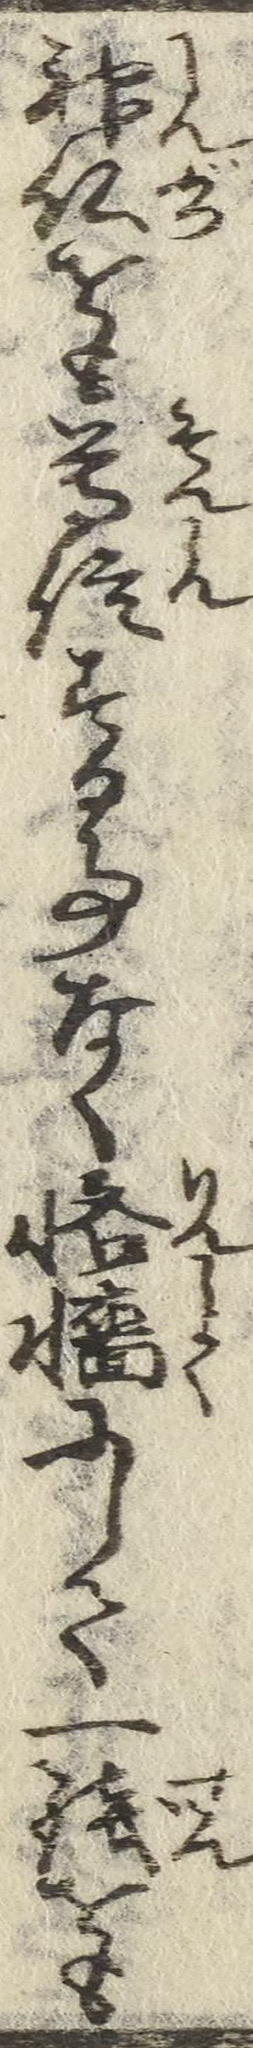神仏をも尊信する事なく悋嗇にして一銭をも
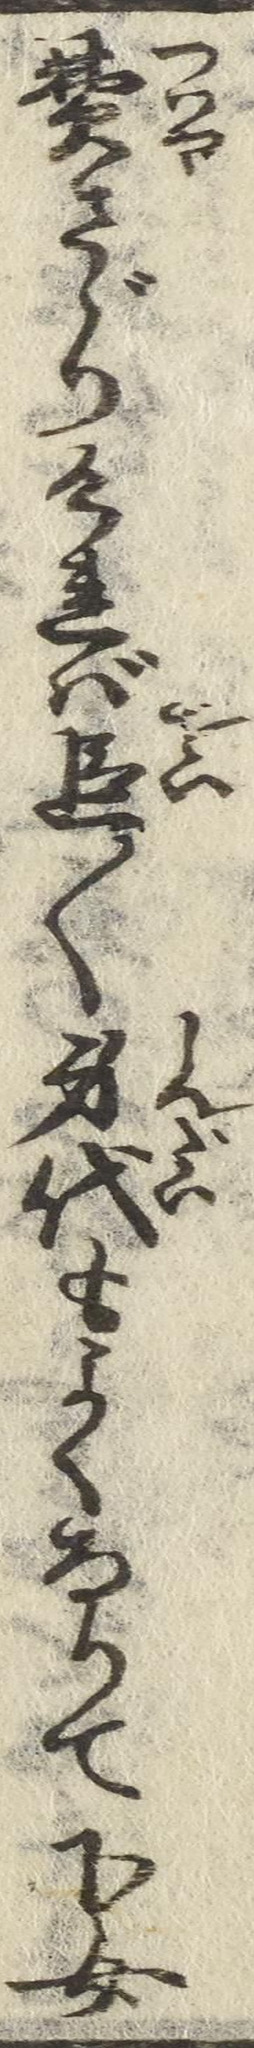費さゞりたれば追〳〵身代もよくなりて乙女
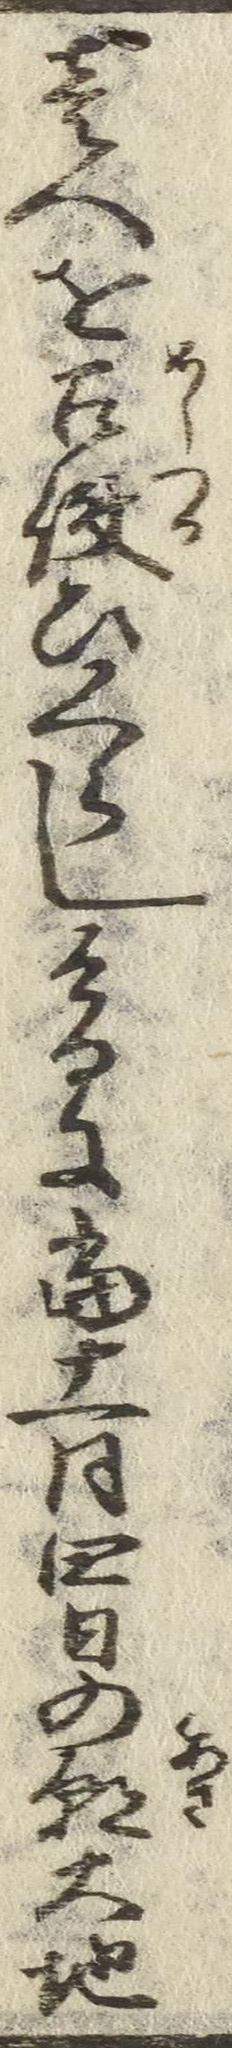美人を召使ひくらしけるに当十一月四日の秋大地
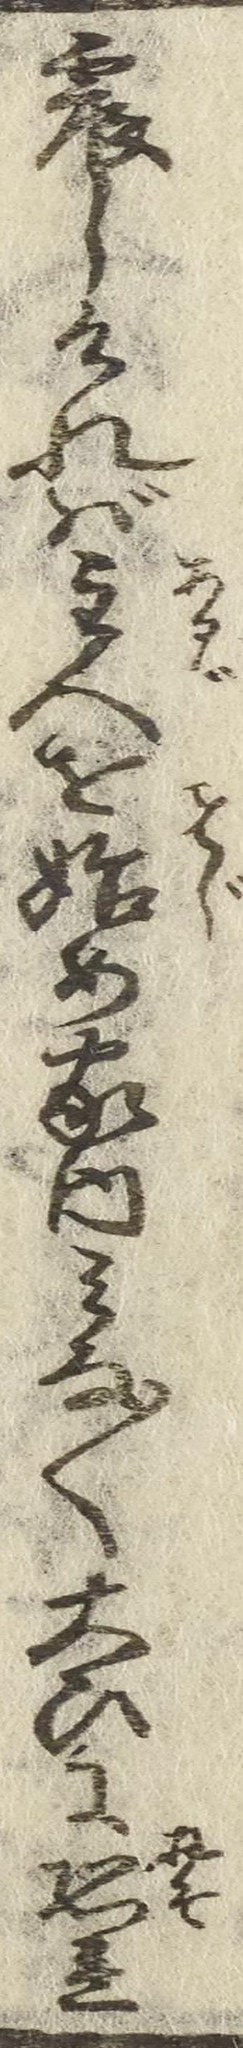震しければ主人を始め家内みな〳〵大ひに恐れ
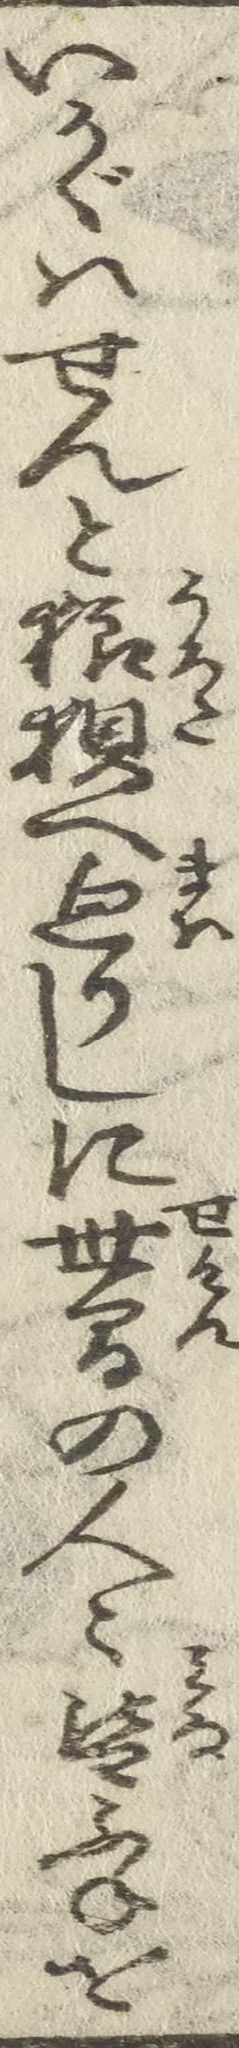いかゞせんと狼狽へ廻りしに世間の人〻皆ふねを
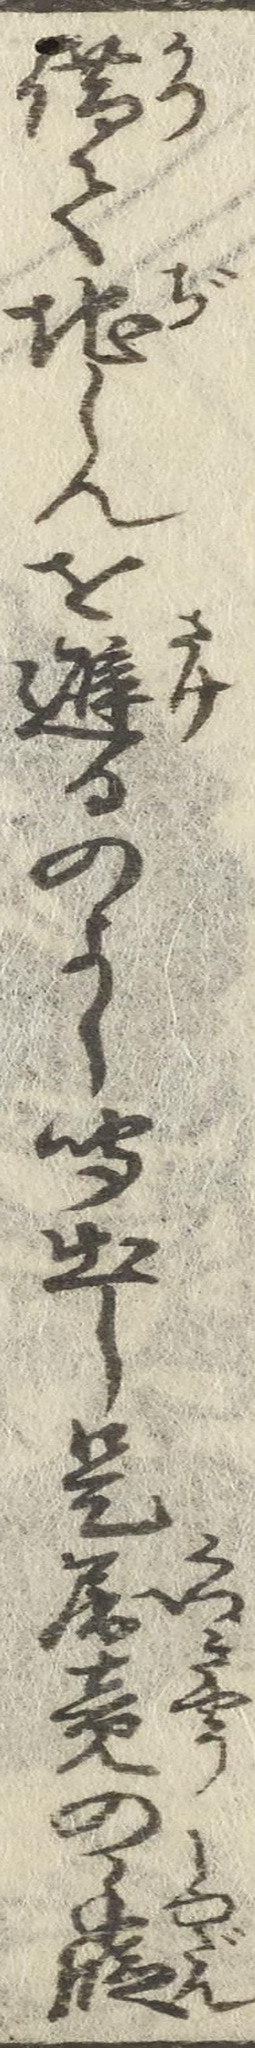借て地しんを避るのよし聞出し是屈竟の手段
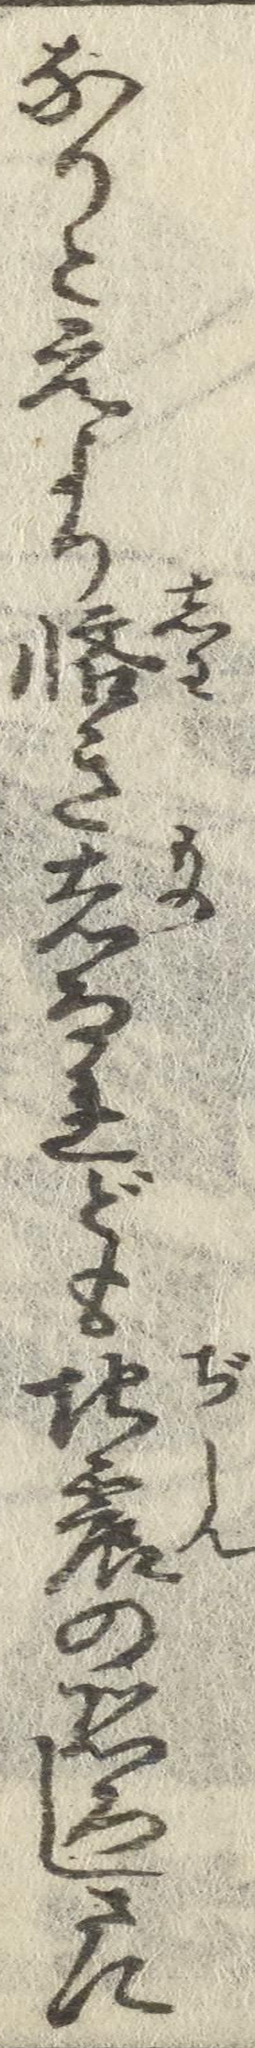なりと元より悋き者なれども地震の恐ろしさに
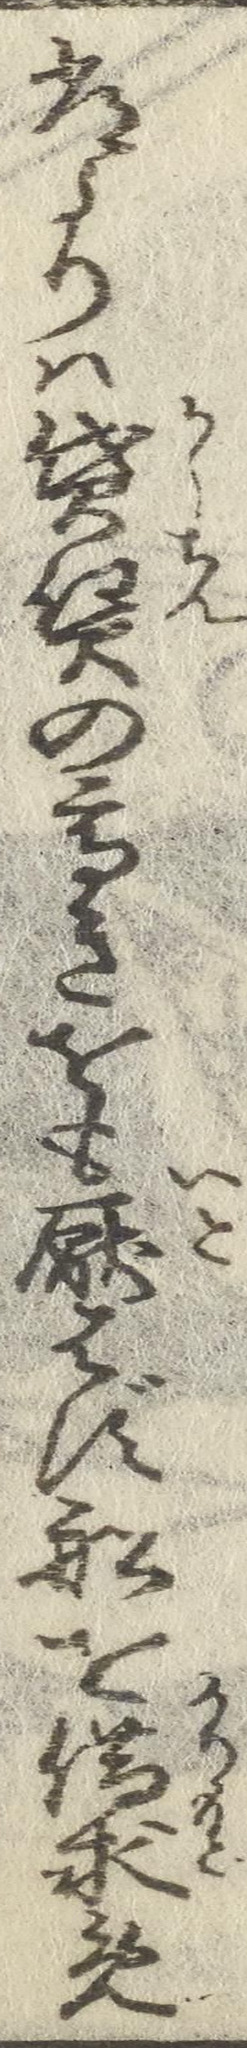常よりは貸賃の高きをも厭はず舟を借求め
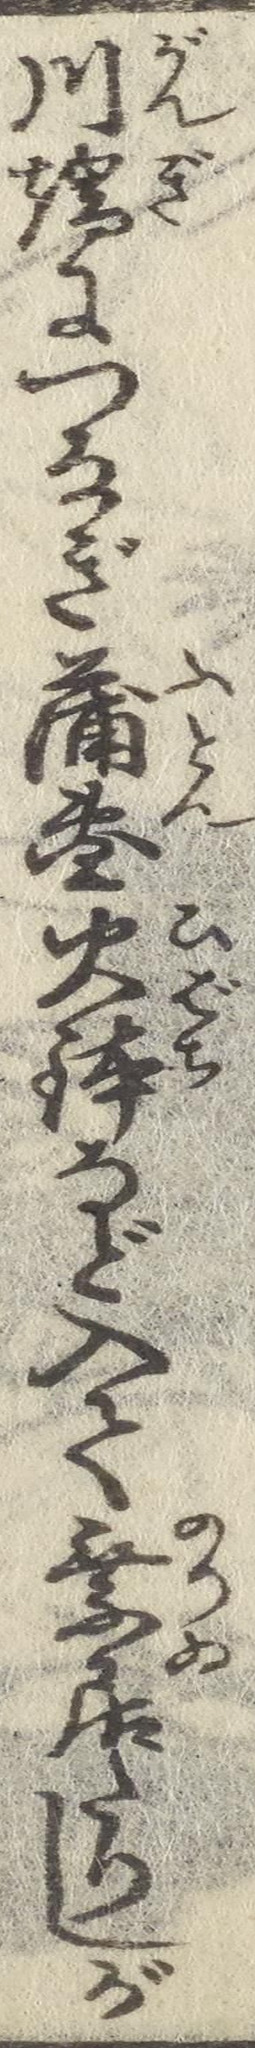川端につなぎ蒲団火鉢など入て乗居たりしが
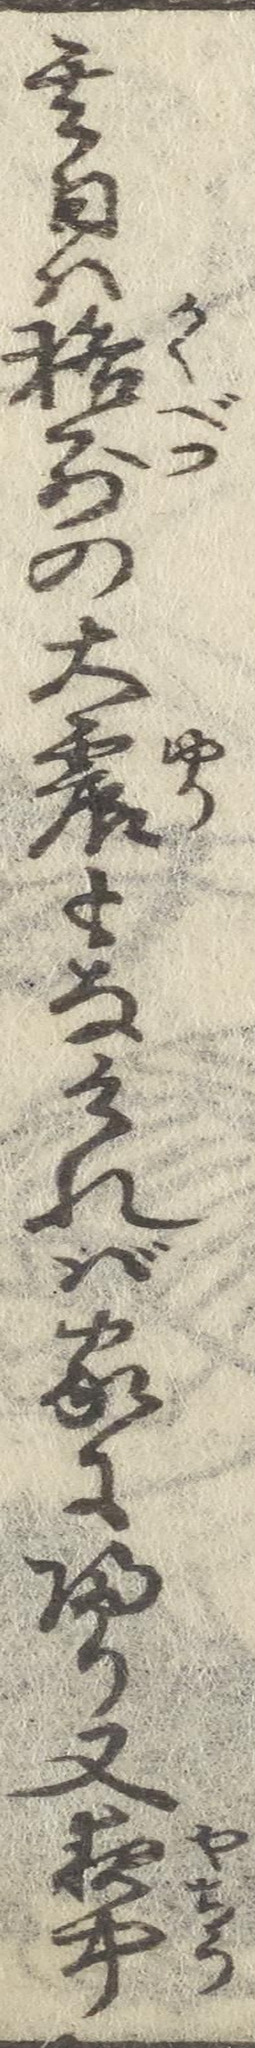其日は格別の大震もなければ家に帰り又家中
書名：大地震　津涛乃奇談　第二集
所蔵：東京大学地震研究所図書室 Earthquake Research Institute Library, The University of Tokyo, JAPAN
